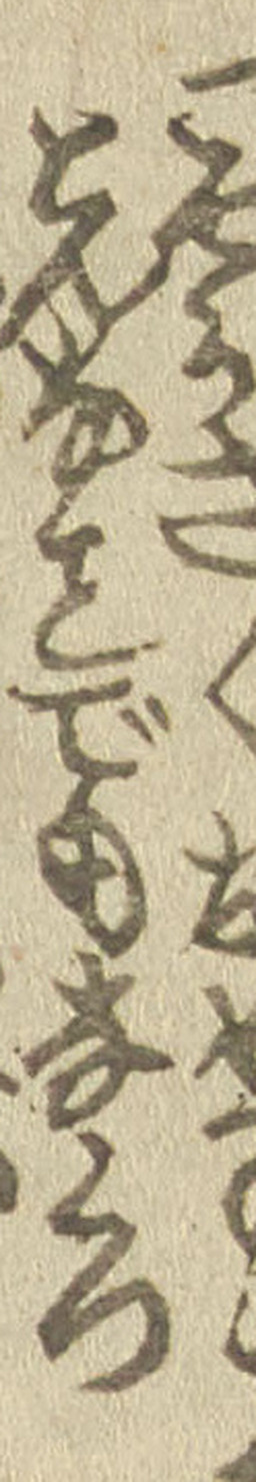こんなことでもなくつ
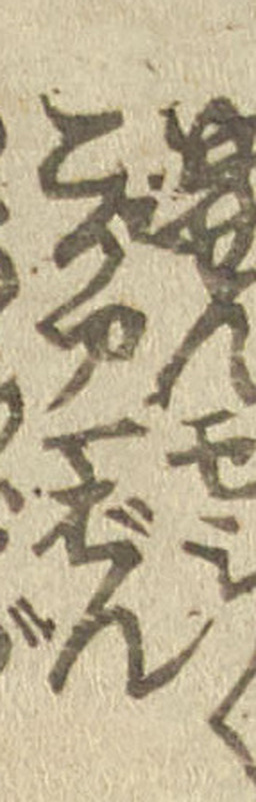こらア一ばん
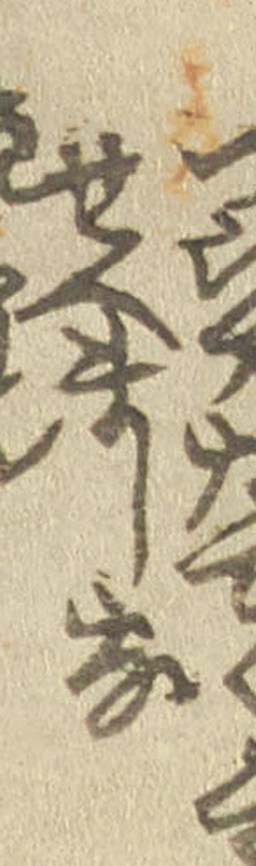せへましな
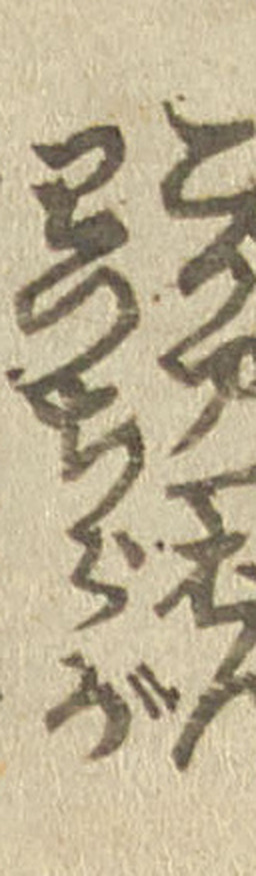わつちらが
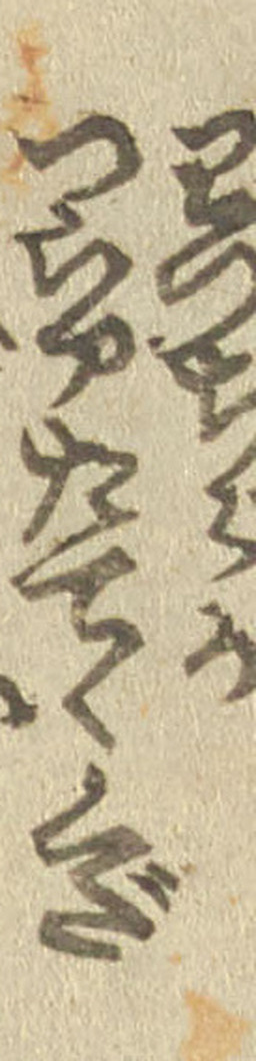つらアたてゝくだ
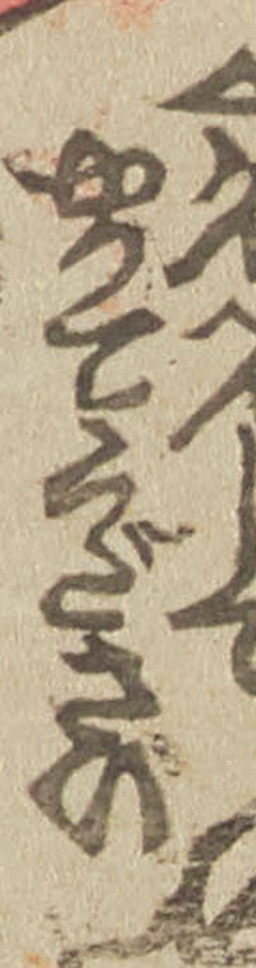やつてくださひ
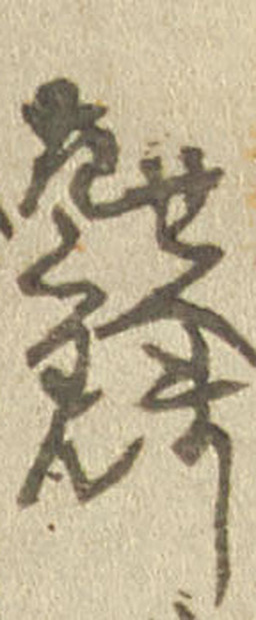たくわん
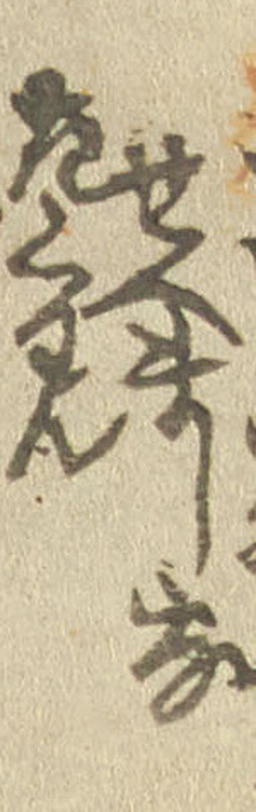たくわん
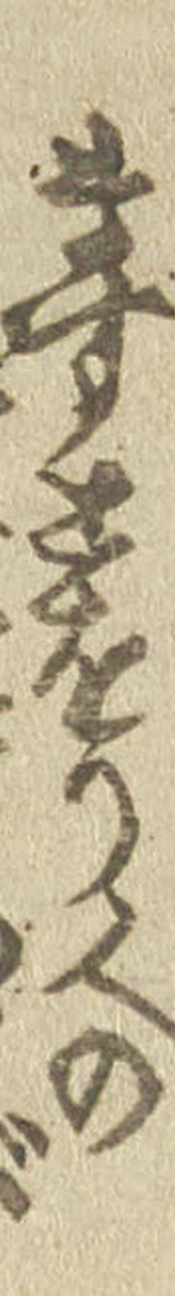ますとをり人の
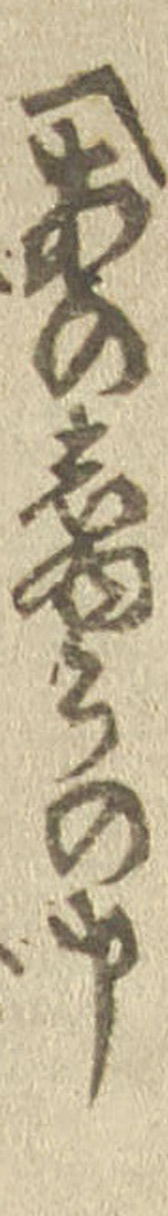〽あのしゆうの申
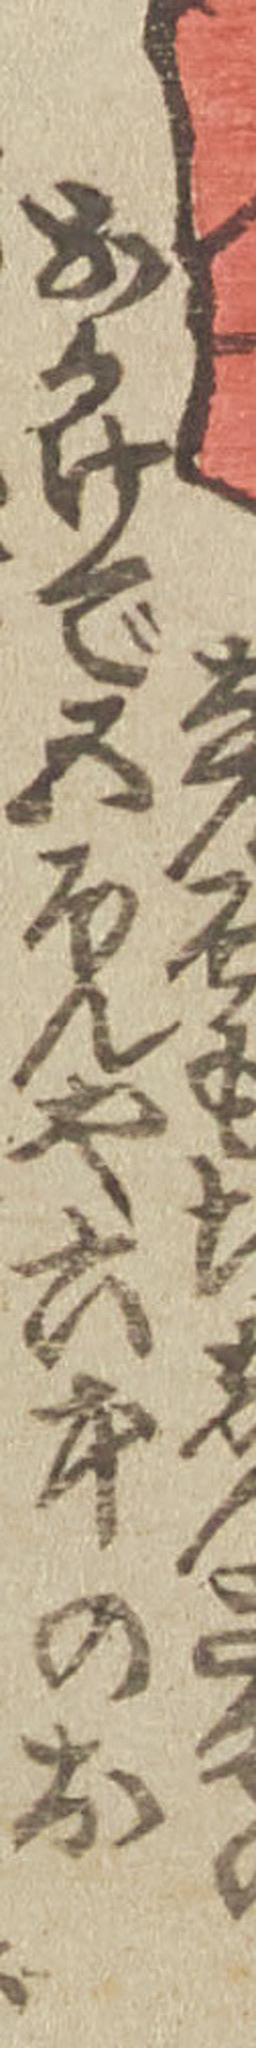おかけで五ほんや六本のお
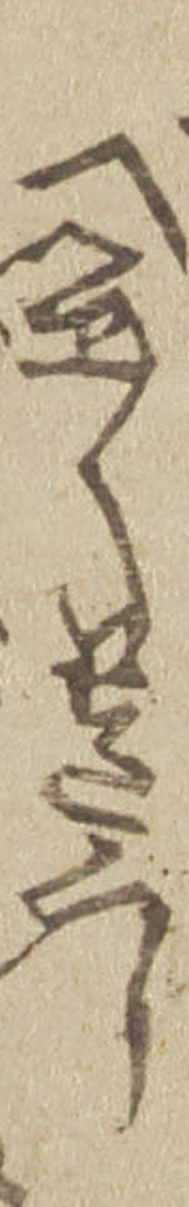〽へヱ〳〵わたくし
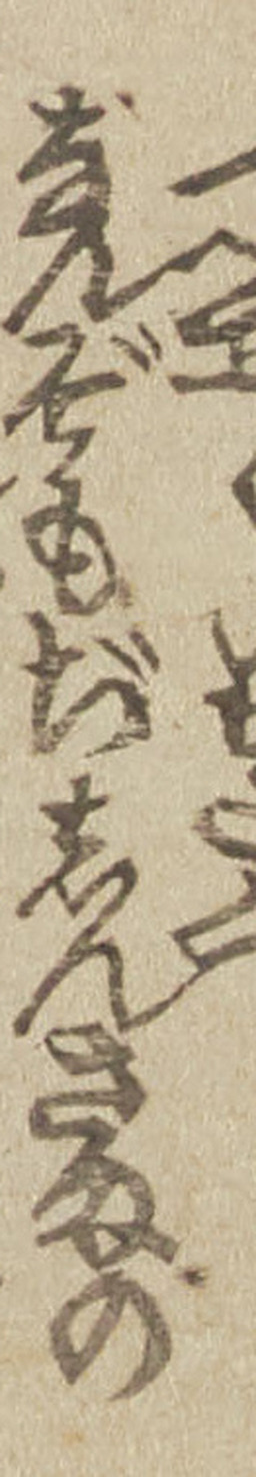なんぞもぢしんさまの
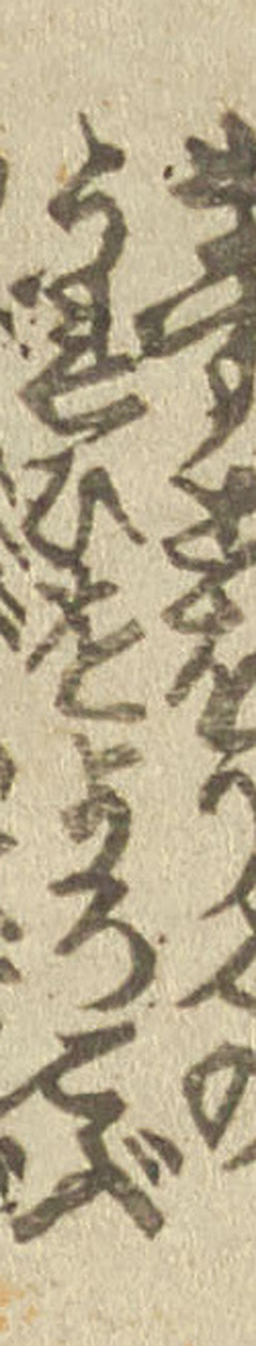うれひをよろこぶ
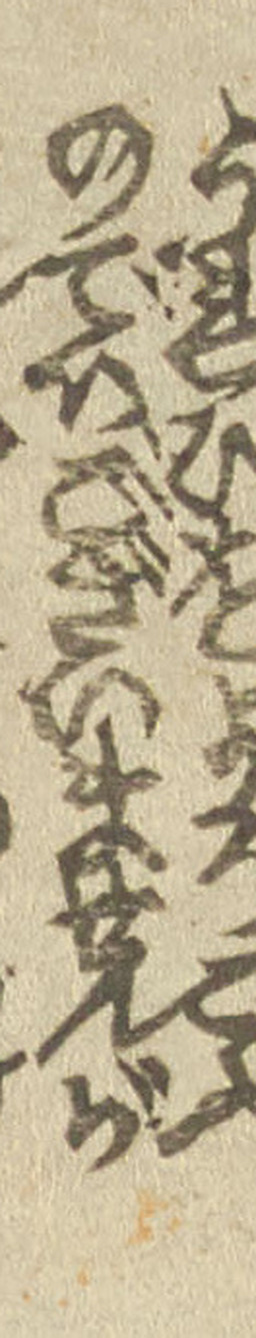のではございませんが
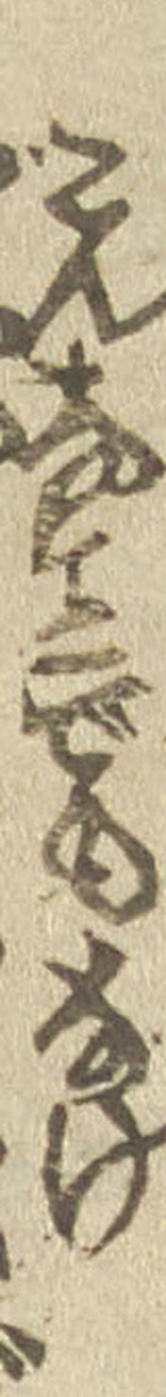こんなことでもなけ
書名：生捕ました三度の大地震
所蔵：東京大学総合図書館 General Library in the University of Tokyo, JAPAN
